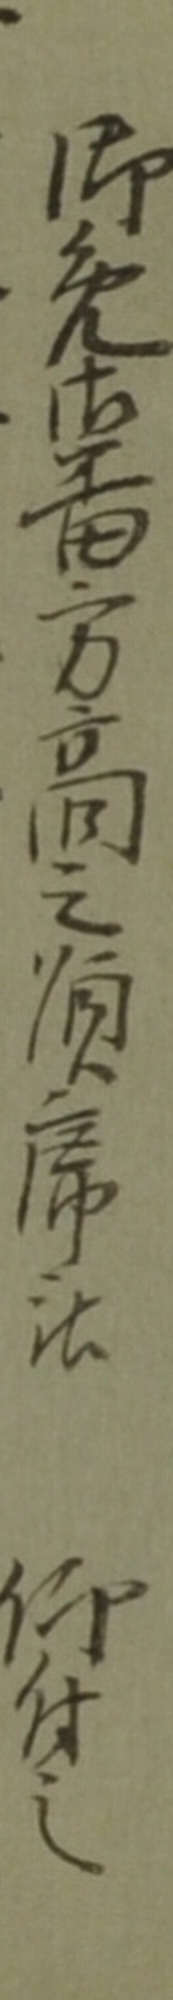御免御番方高之順席被仰付之
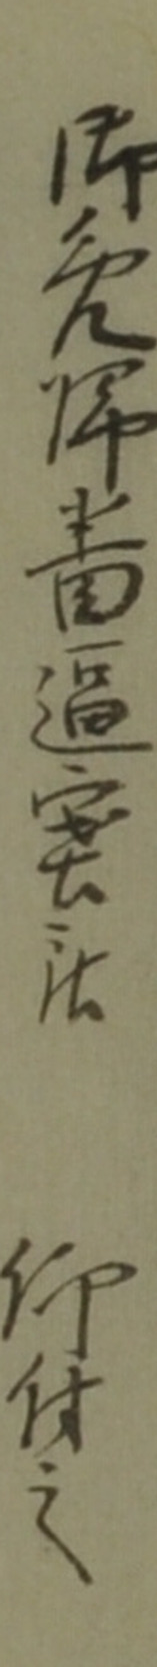御免帰番逼塞被仰付之
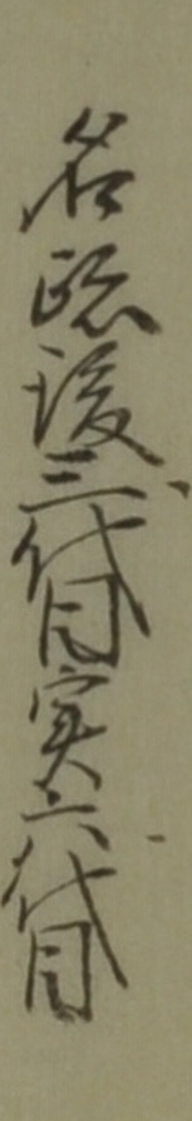名跡後三代目実六代目
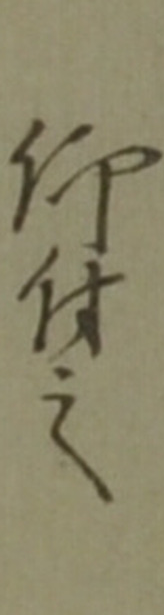仰付之
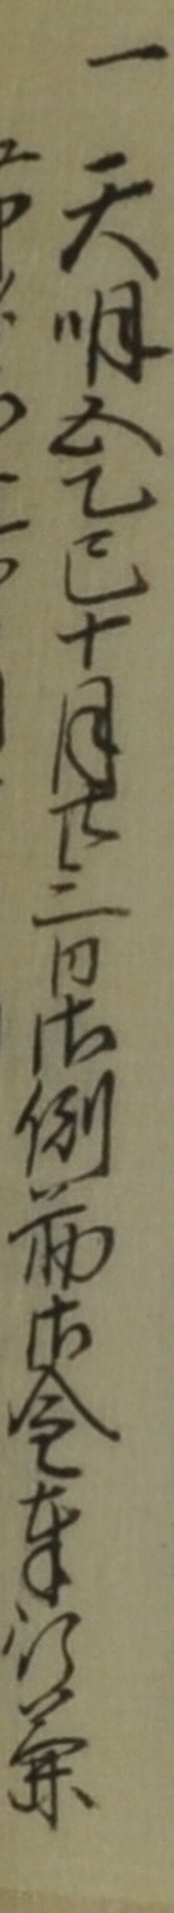一天明五乙巳十月廿三日御側勤御金奉行兼
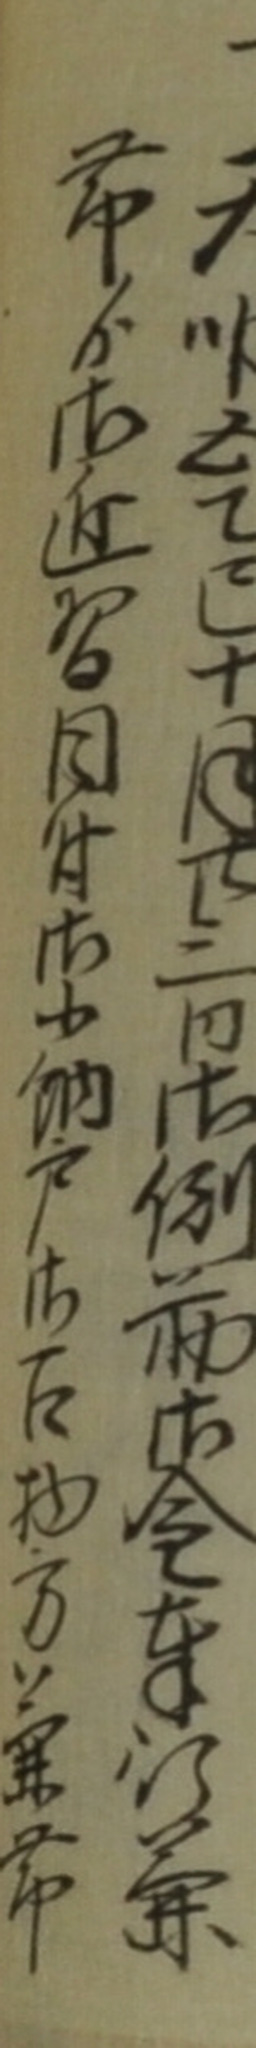帯ゟ御近習目付御小納戸御召物方兼帯
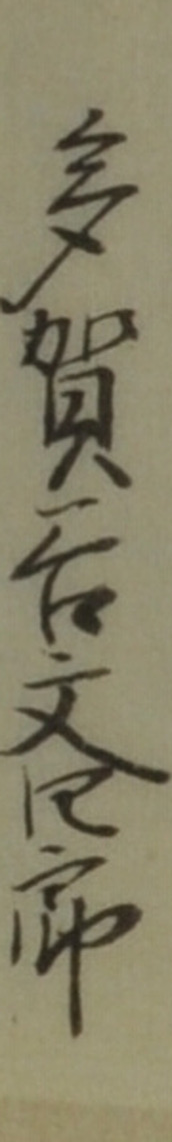多賀谷文四郎
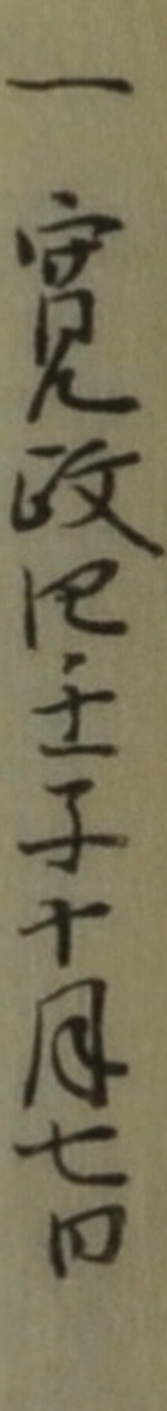一寛政四壬子十月七日
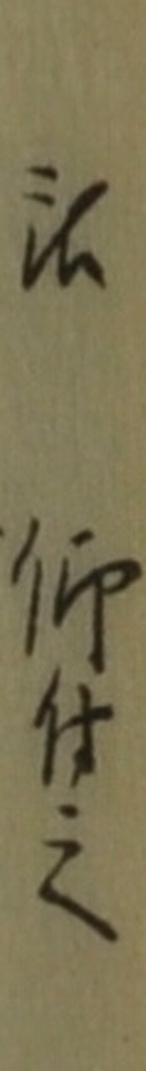被仰付之
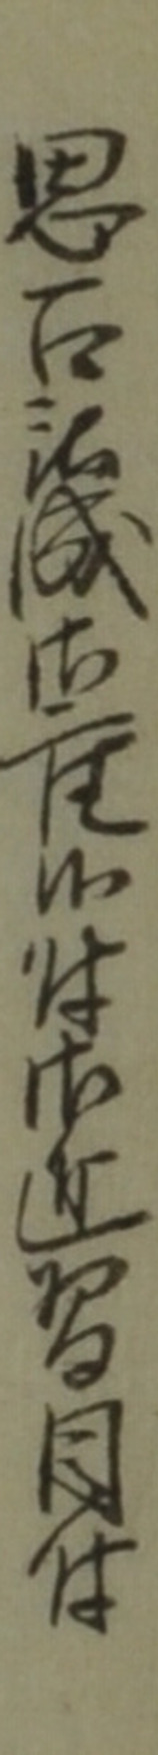思召被成御座候付御近習目付
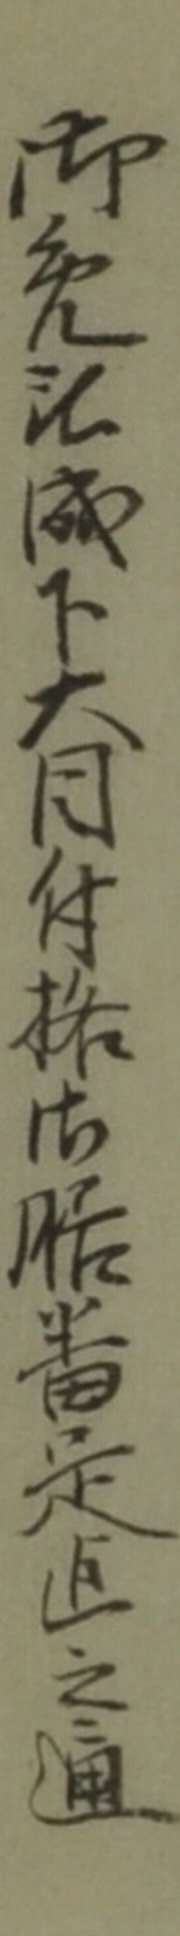御免被成下大目付格御膳番是迄之通
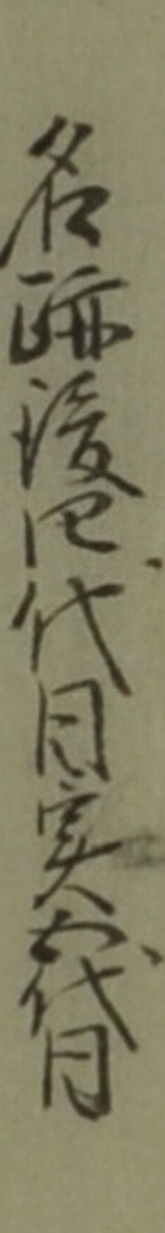名跡後四代目実五代目
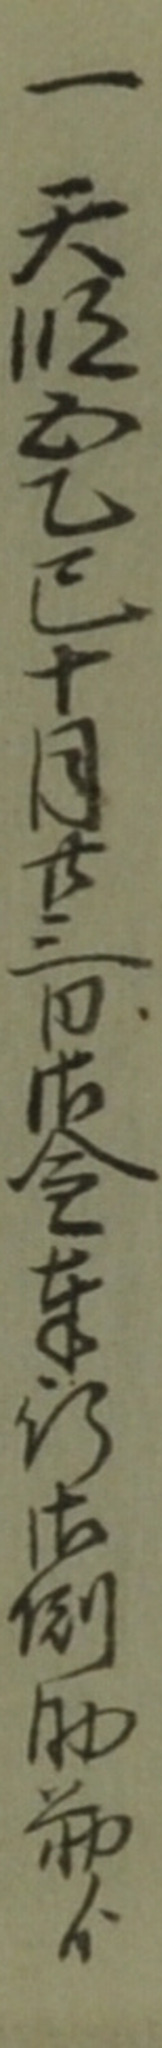一天明五乙巳十月廿三日御金奉行御側助勤ゟ
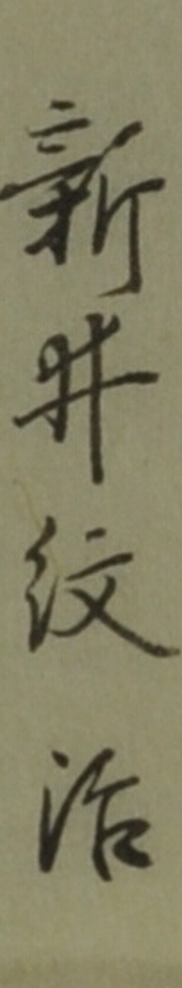新井紋治
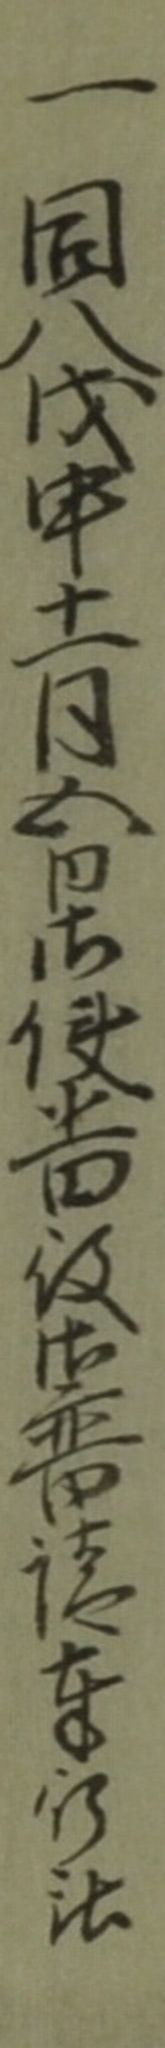一同八戊申十一月五日御使番役御普請奉行被
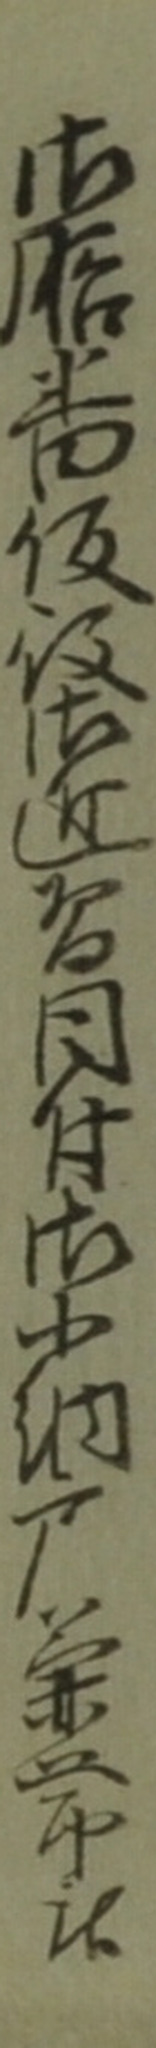御膳番仮役御近習目付御小納戸兼帯被
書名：諸御役代々録（四）
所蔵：伊那市立高遠町図書館・合同会社AMANE
